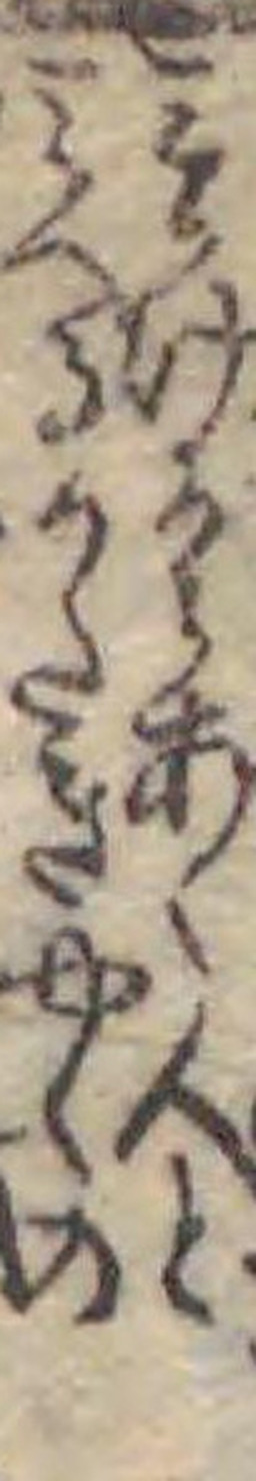みへるかたきやくの
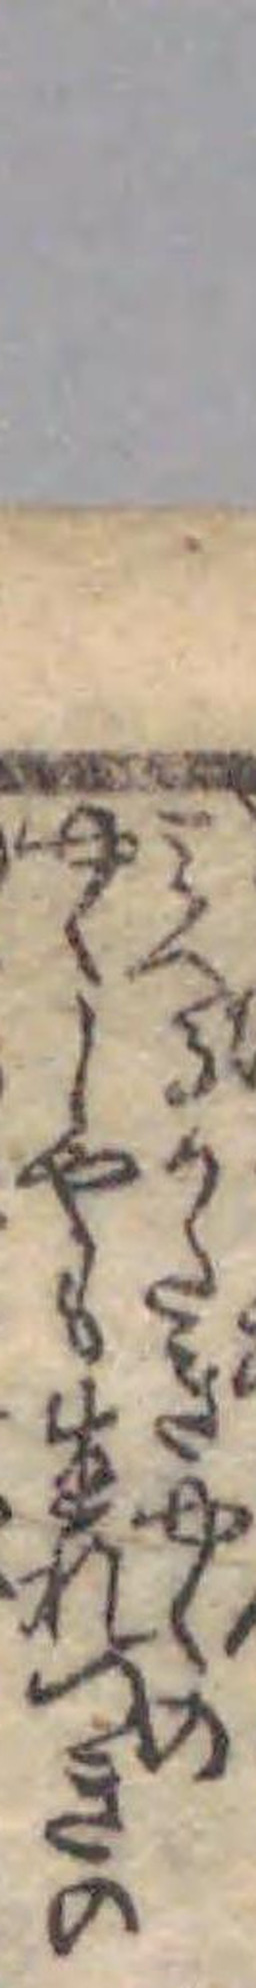やくしやも生れつきの
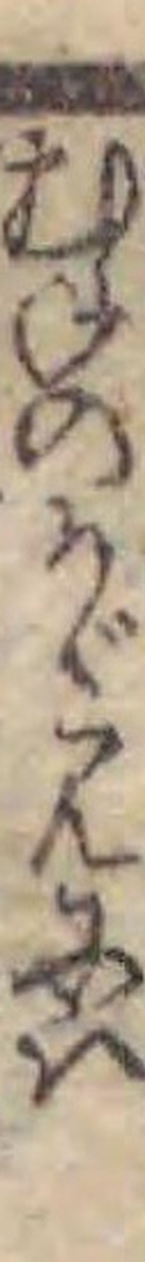むねのかゞみには
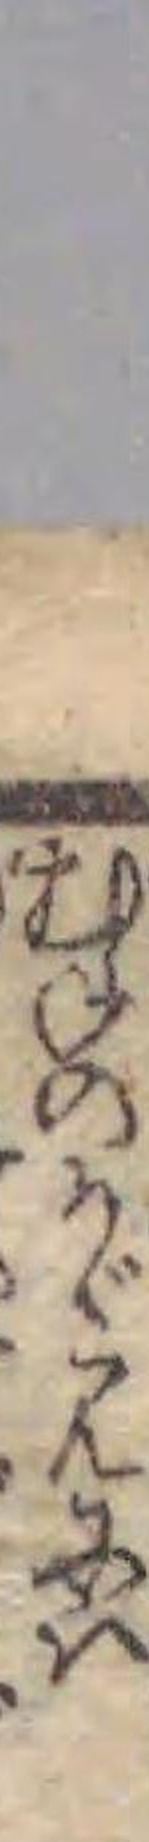むねのかゞみには
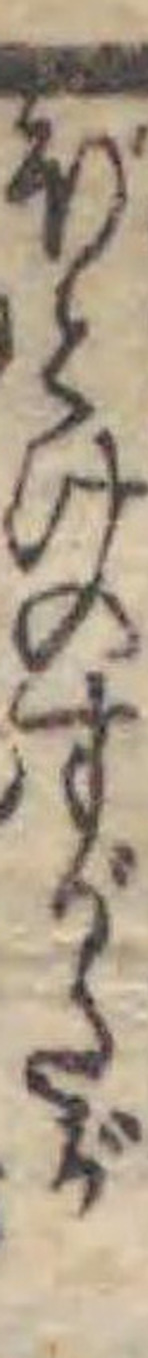ほとけのすがたが
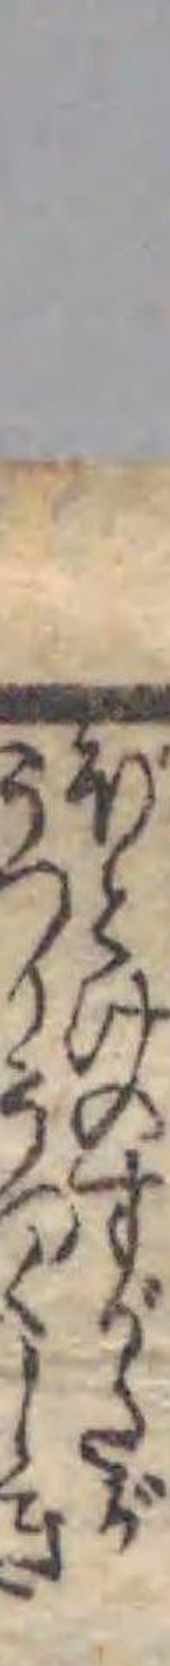ほとけのすがたが
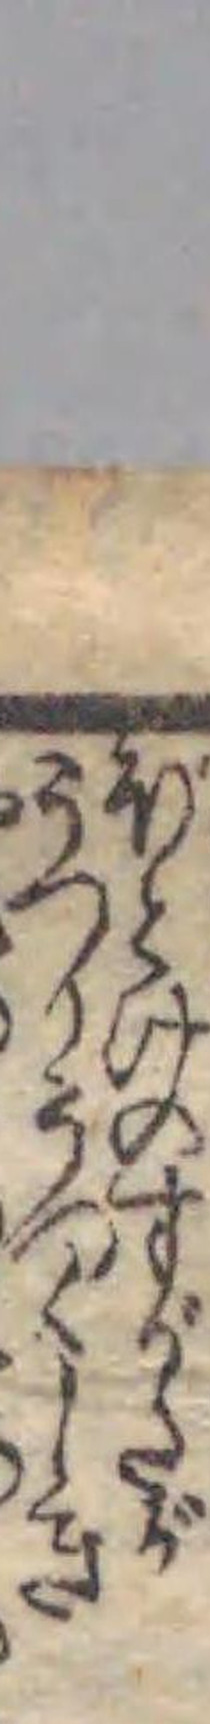うつりうつくしき
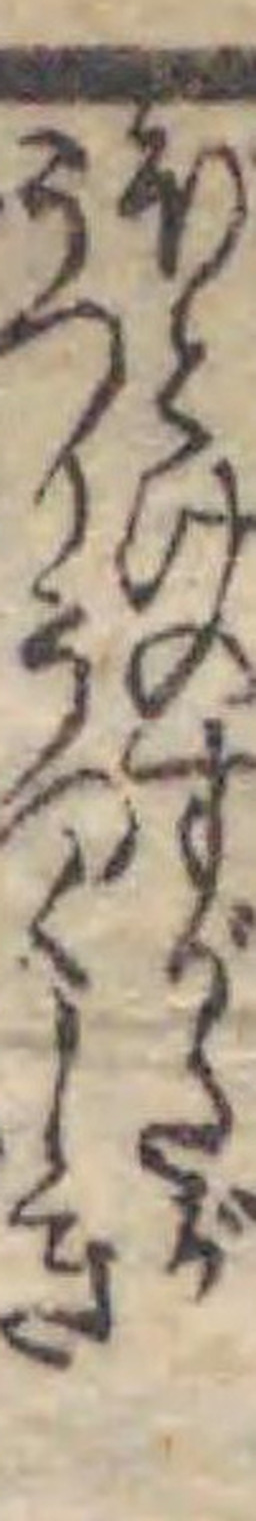うつりうつくしき
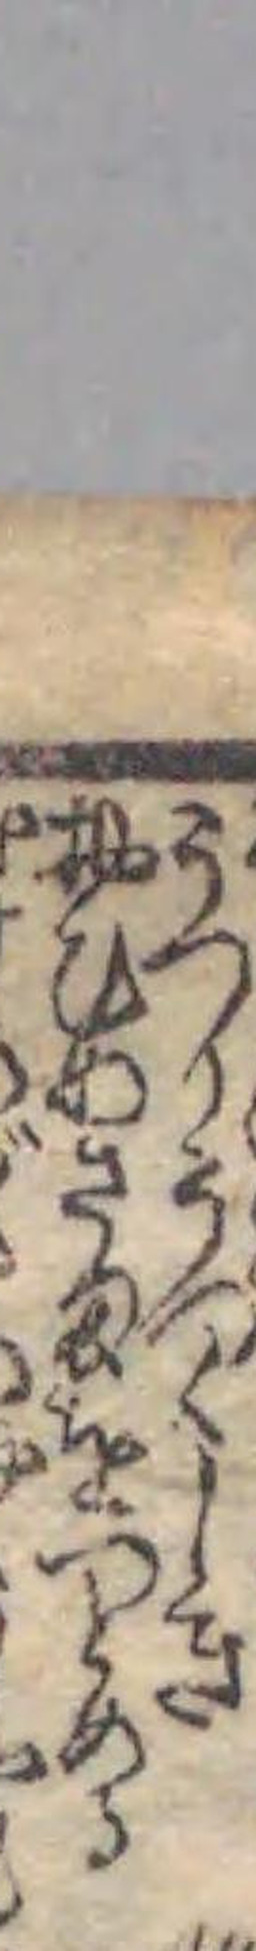おひめさまをつとめる
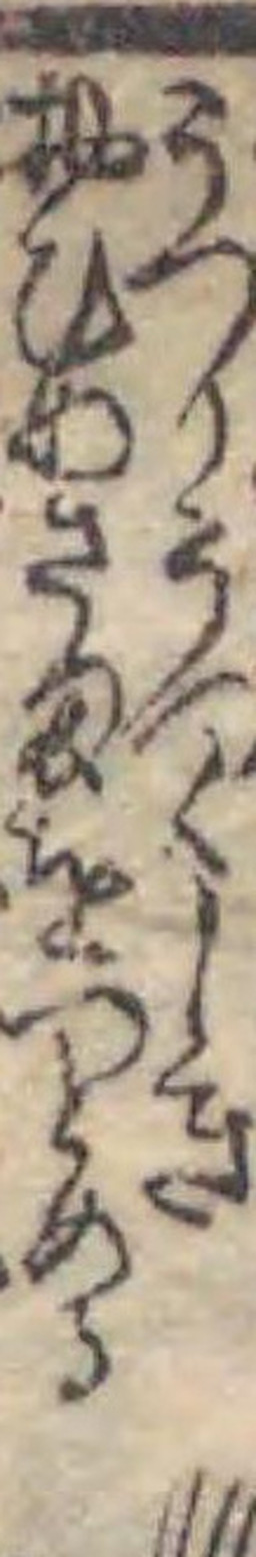おひめさまをつとめる
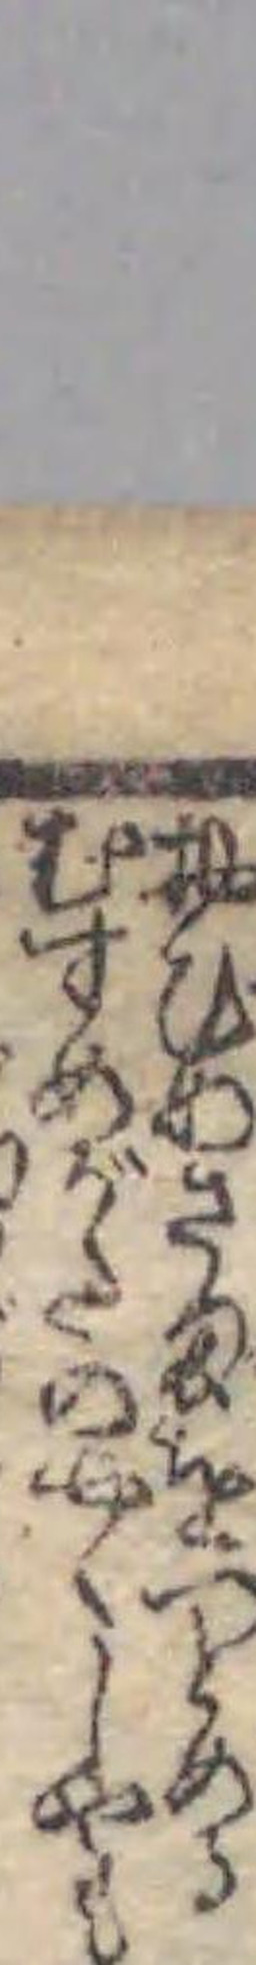むすめがたのやくしやも
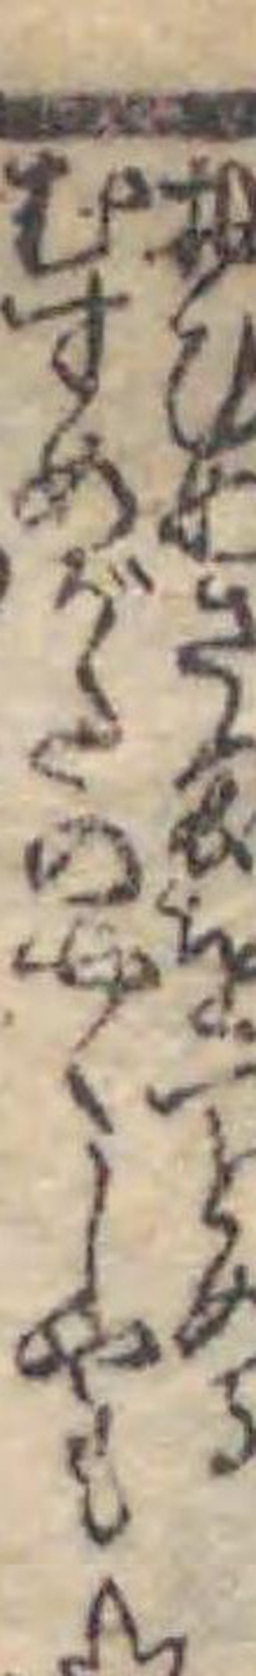むすめがたのやくしやも
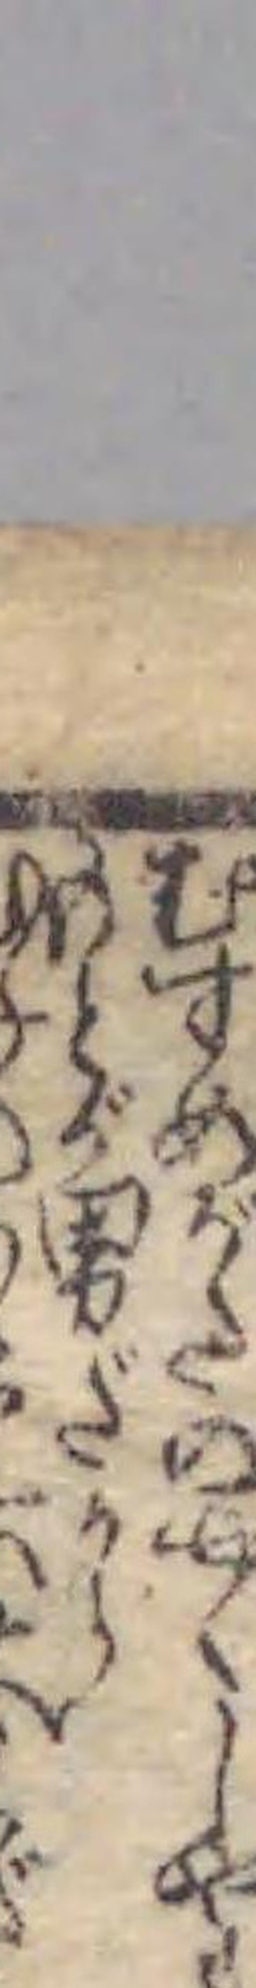もとが男だから
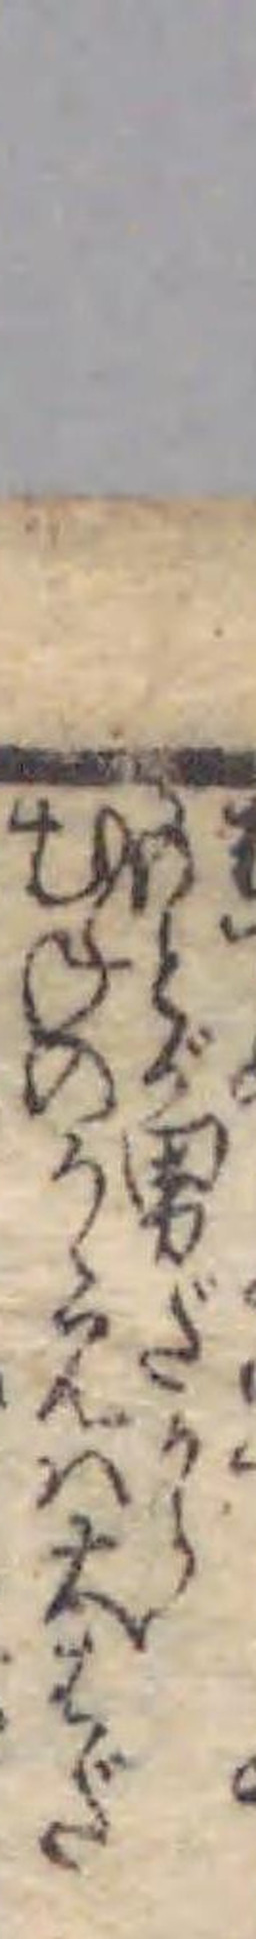むねのかゝみは大はだ
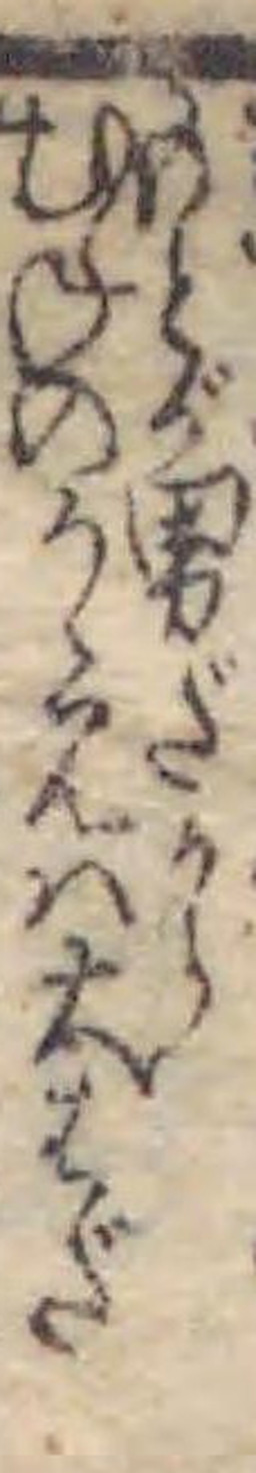むねのかゝみは大はだ
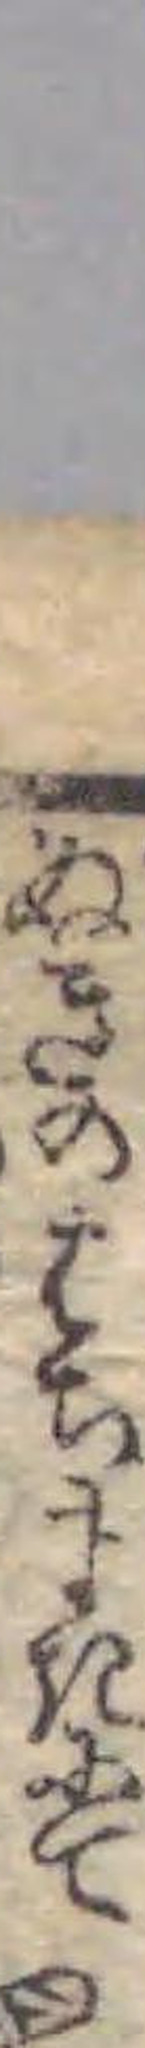ぬきのはちまきにて
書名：人心鏡写絵 : 3巻
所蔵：国立国会図書館 National Diet Library, JAPAN
